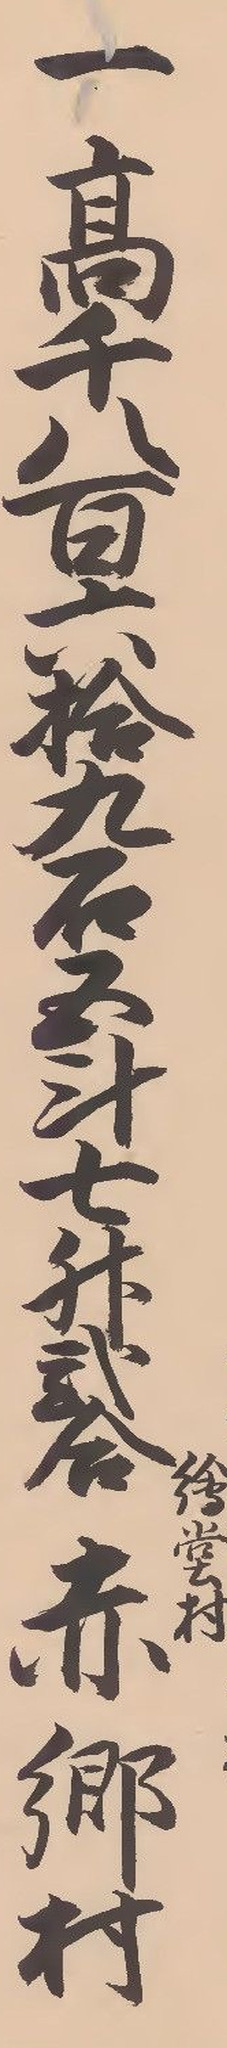一高千八百六拾九石五斗七升弐合赤郷村

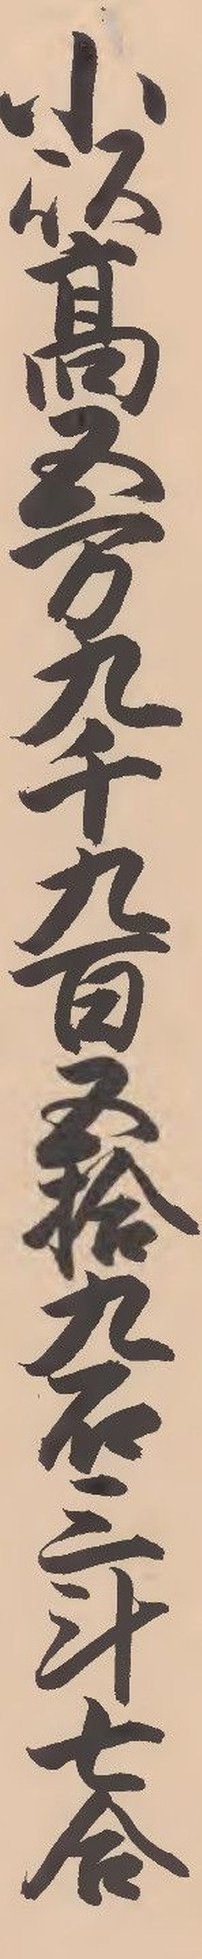小以高五万九千九百五拾九石三斗七合
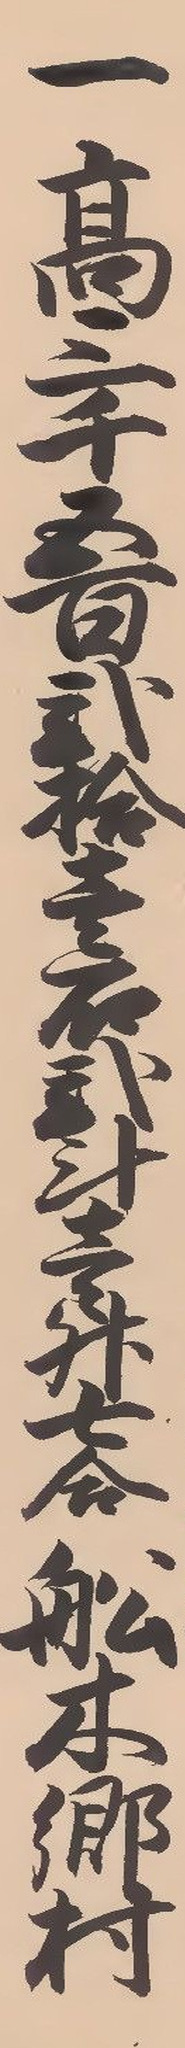一高三千五百弐拾壱石弐斗壱升七合舩木郷村
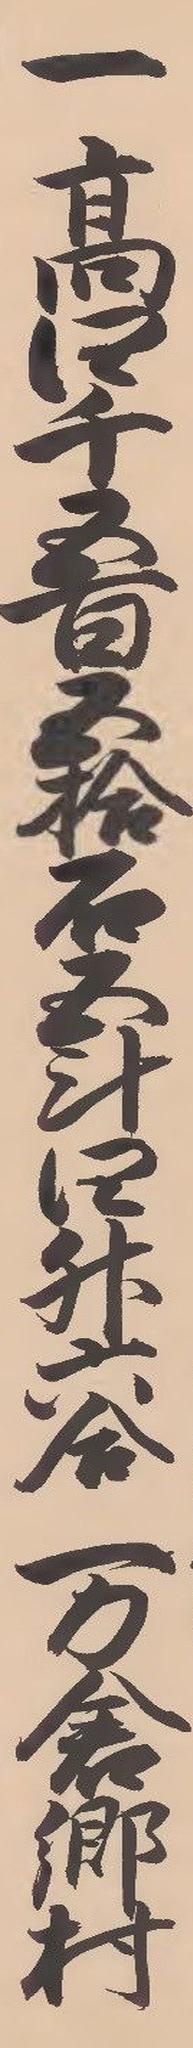一高四千五百五拾石五斗四升六合万倉郷村
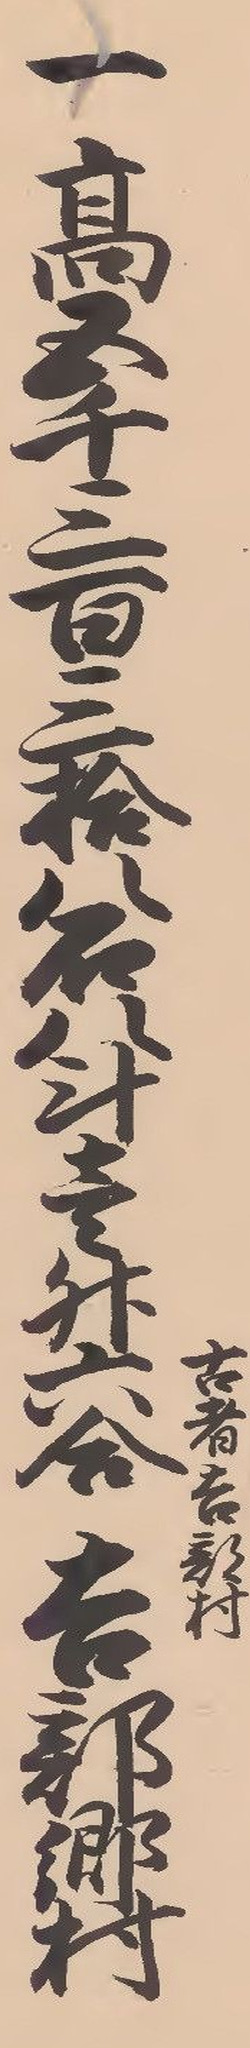一高五千三百三拾八石八斗壱升六合吉部郷村

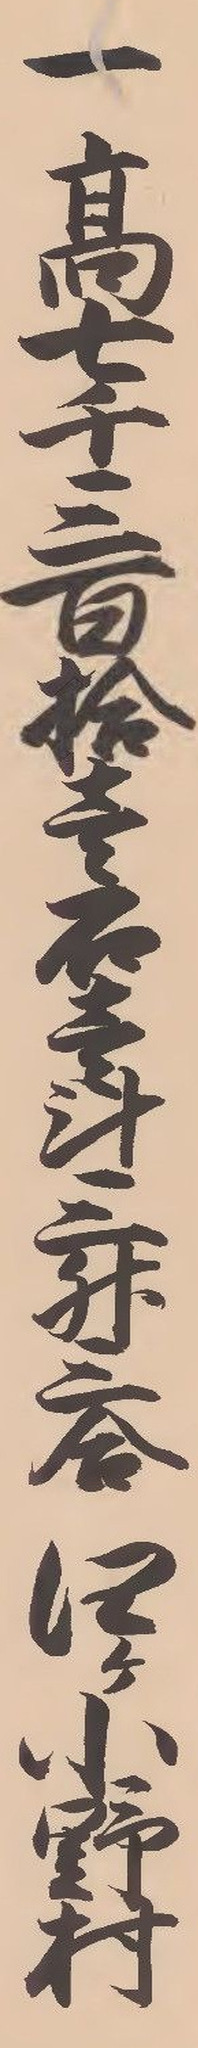一高七千三百拾壱石壱斗三升三合四ヶ小野村
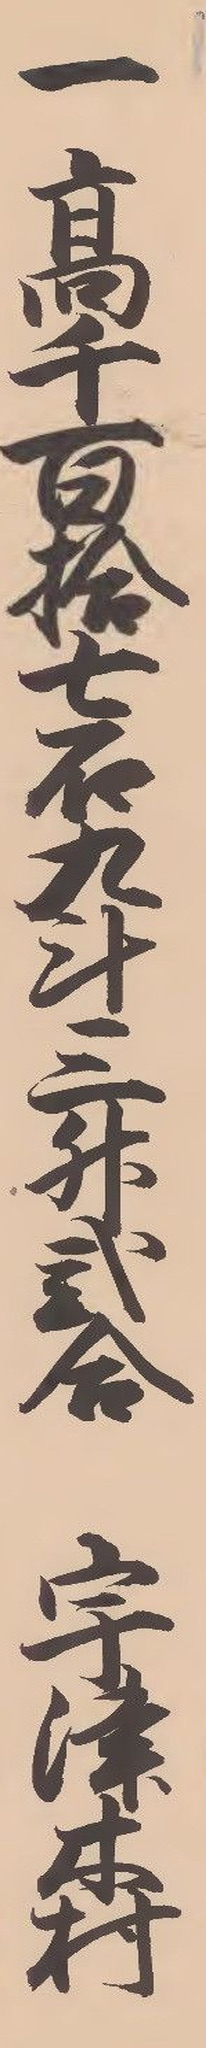一高千百拾七石九斗三升弐合宇津木村
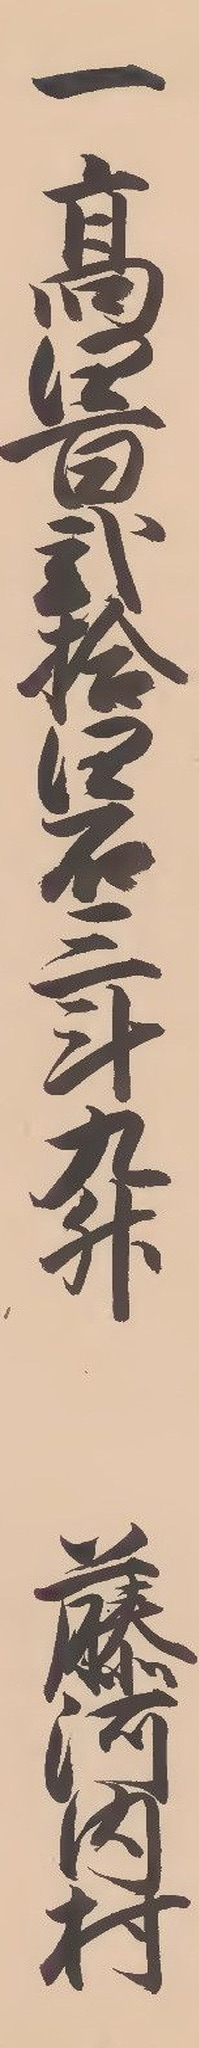一高四百弐拾四石三斗九升藤河内村
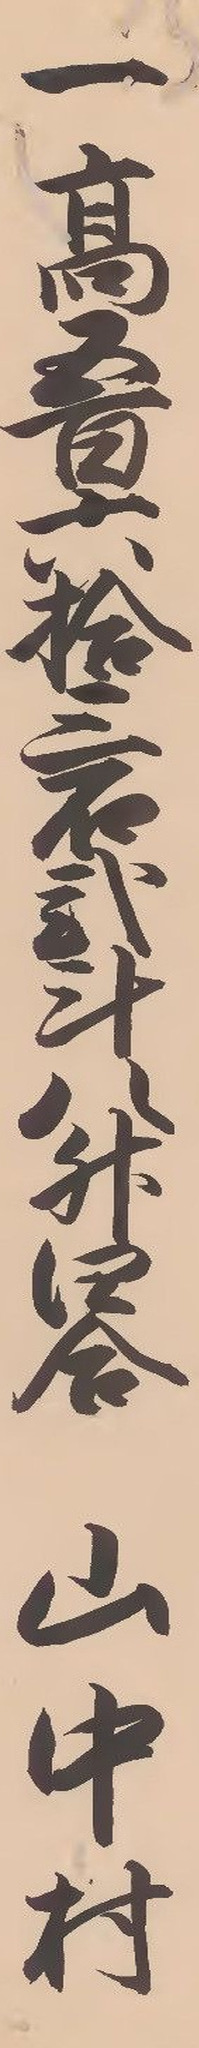一高五百六拾三石弐斗八升四合山中村
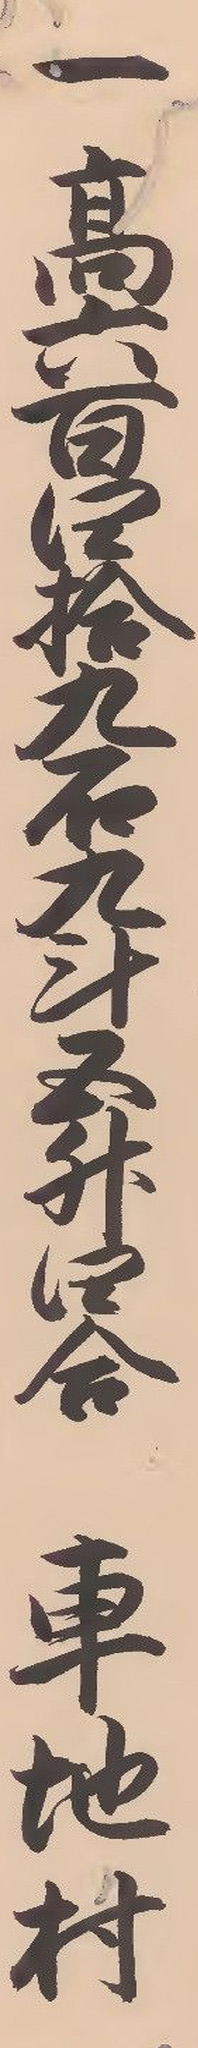一高六百四拾九石九斗五升四合車地村
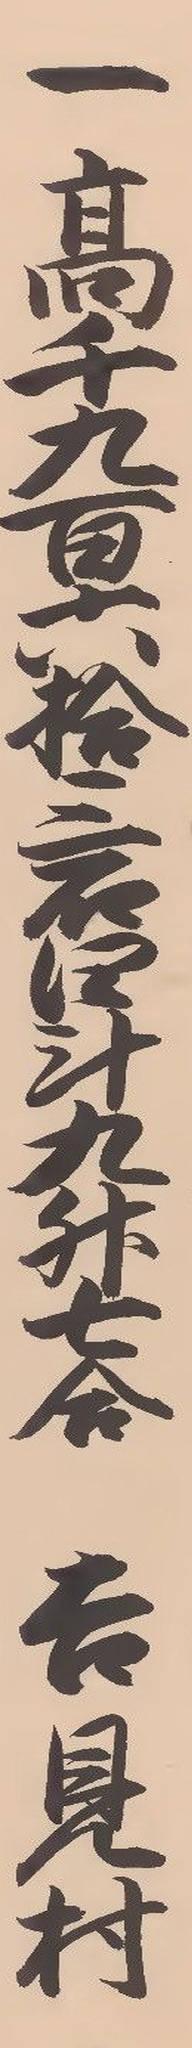一高千九百六拾三石四斗九升七合吉見村
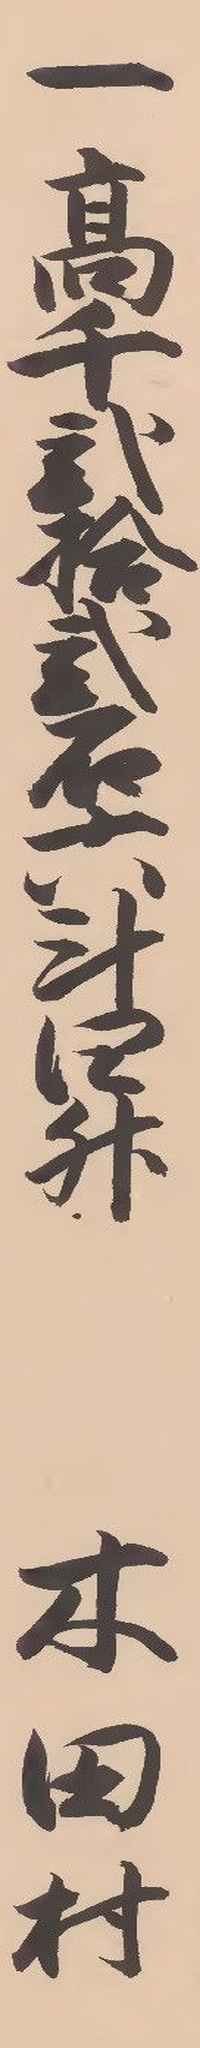一高千弐拾弐石六斗四升木田村
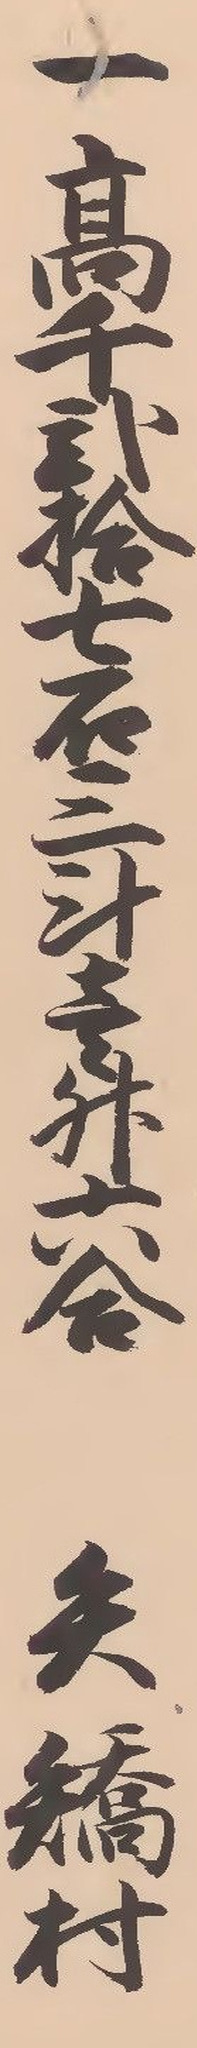一高千弐拾七石三斗壱升六合矢矯村

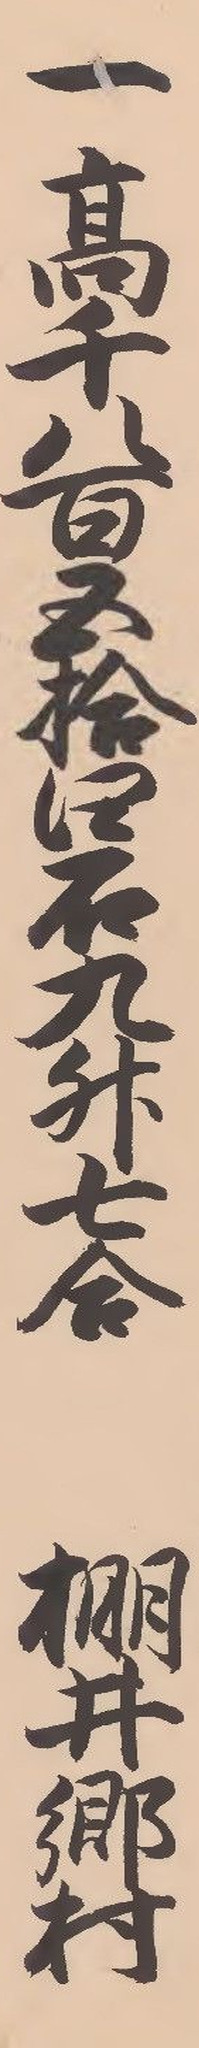一高千八百五拾四石九升七合棚井郷村
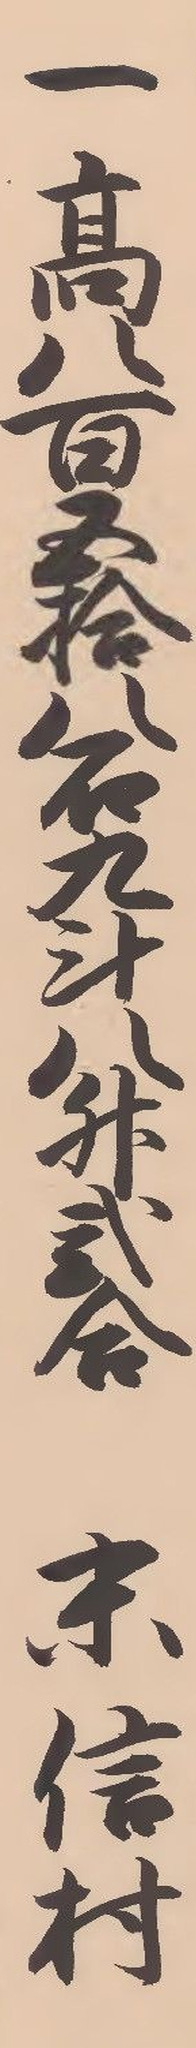一高八百五拾八石九斗八升弐合末信村
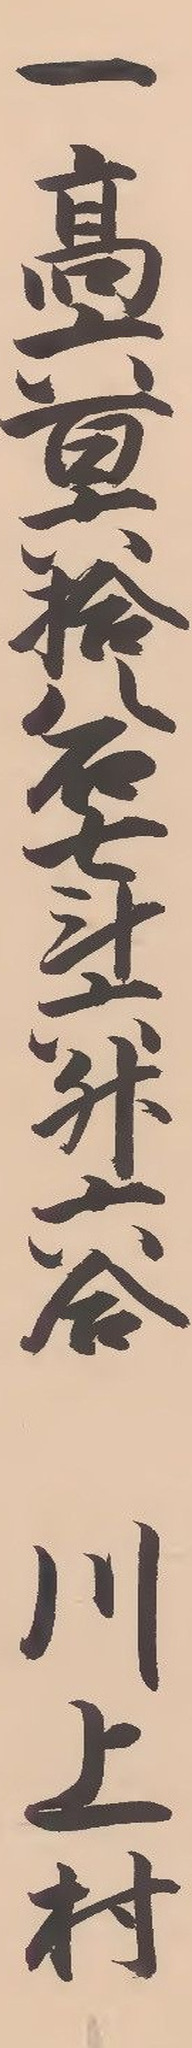一高六百六拾八石七斗六升六合川上村
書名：長門国郷帳
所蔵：国立公文書館 National Archives of Japan
